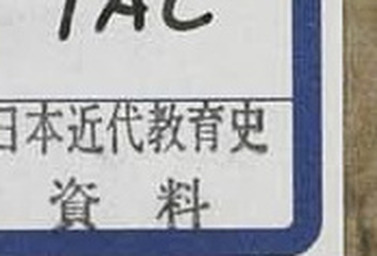日本近代教育史
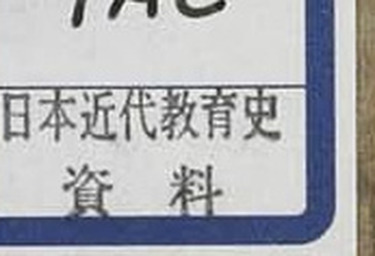日本近代教育史

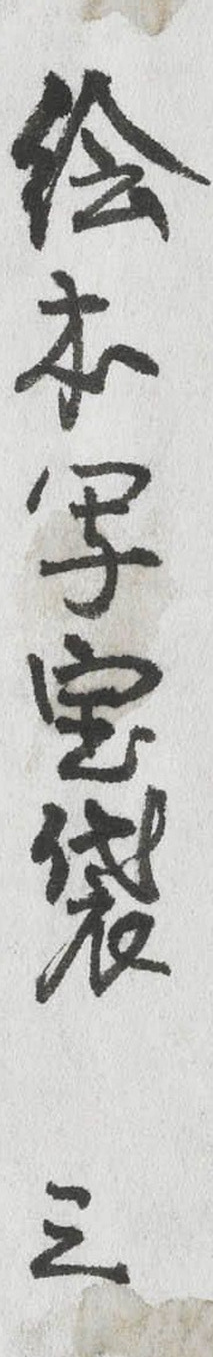絵本写宝袋三
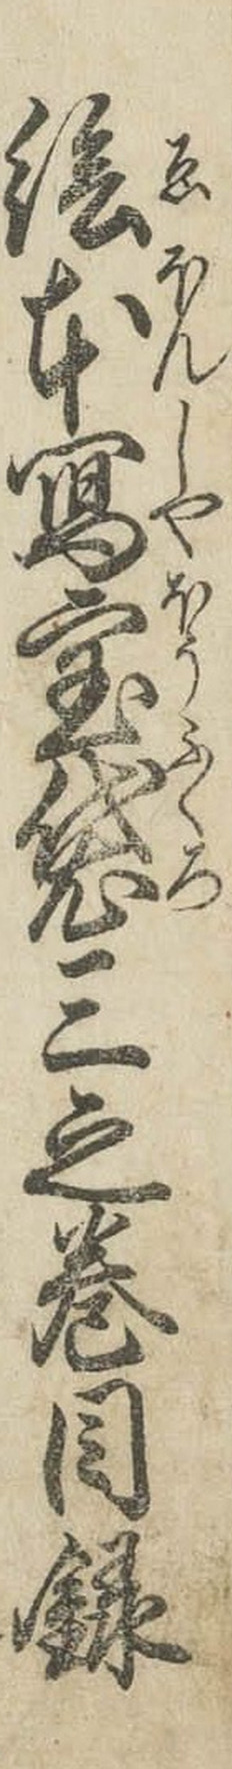絵本写宝袋三之巻目録
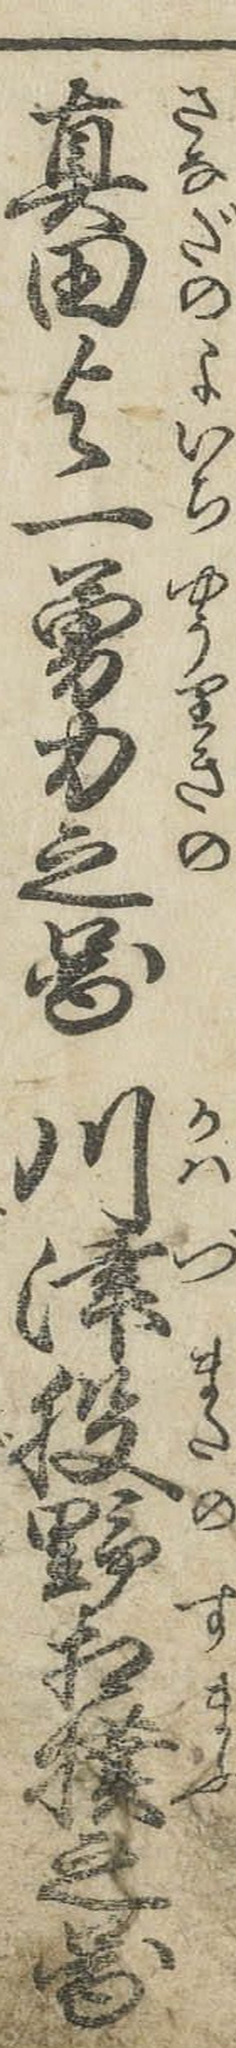真田与一勇力之図川津股野相撲之図

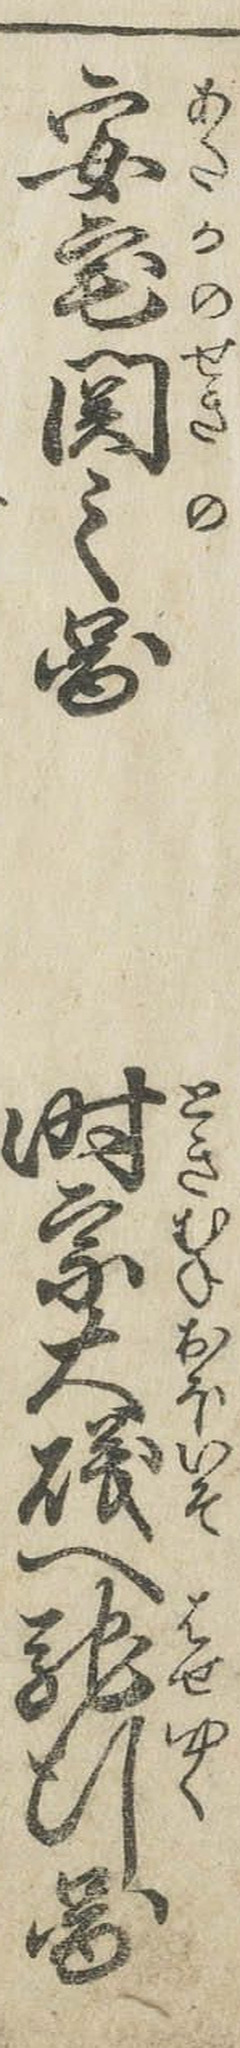安宅関之図時宗大磯へ馳行図
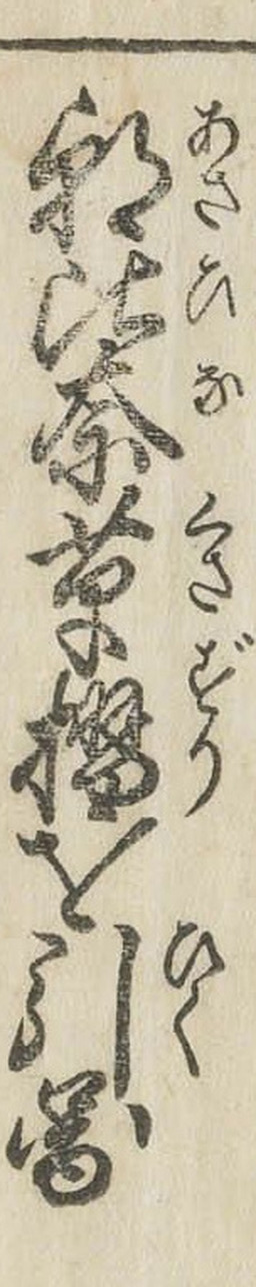朝比奈草摺を引図
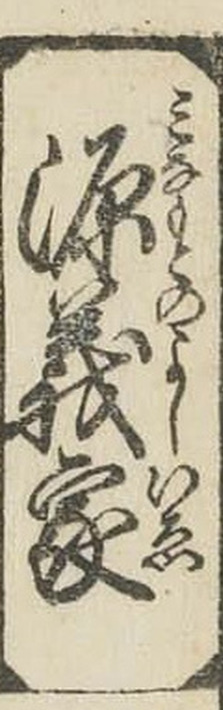源義家
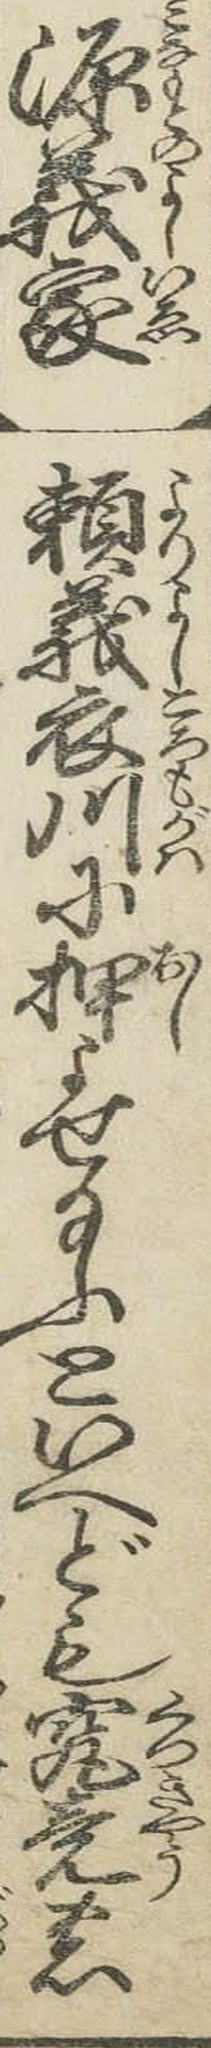頼義衣川に押よせ給ふといへども究竟の
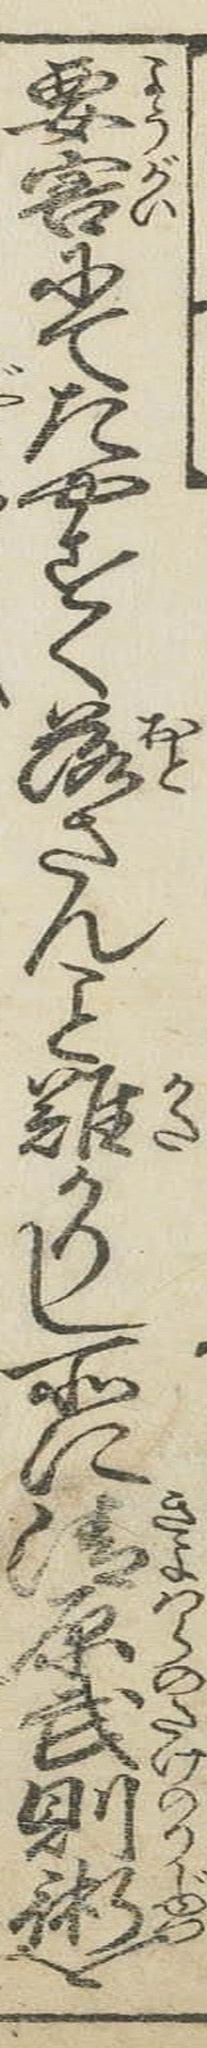要害にてたゆすく落さんこと難かりし所に清原武則術を
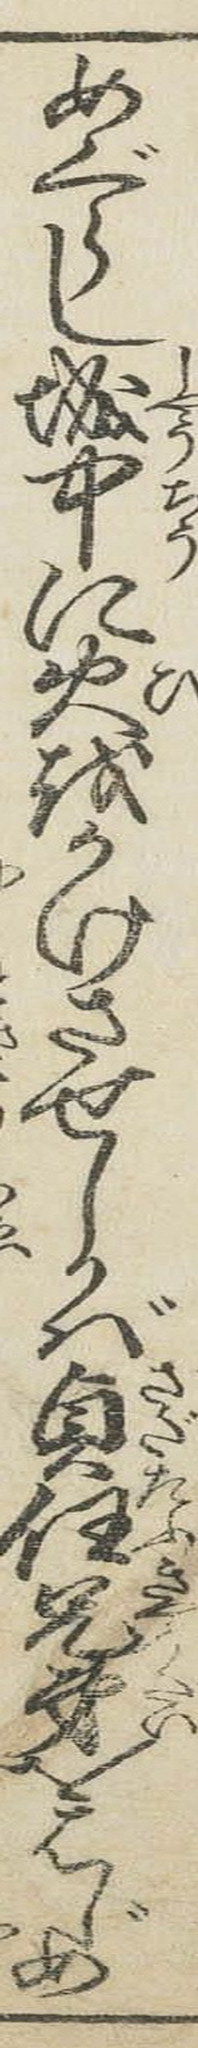めぐらし城中に火をかけさせしかば貞任兄弟をはじめ
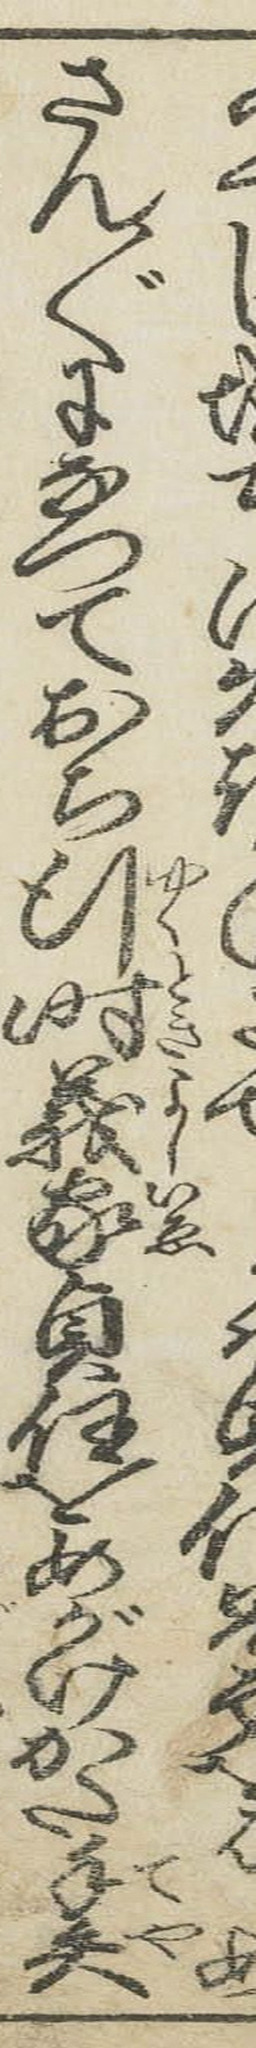さん〴〵になつておち行時義家貞任をめがけかた手矢
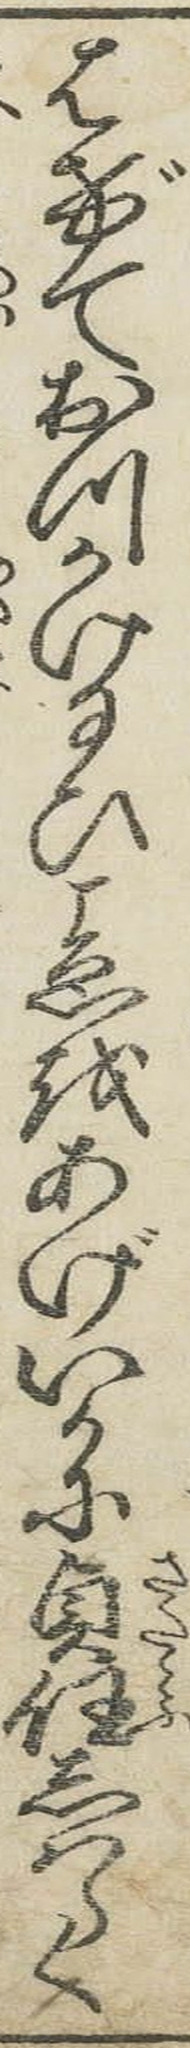はげておつかけ給ひこゑをあげていかに貞任しはらく
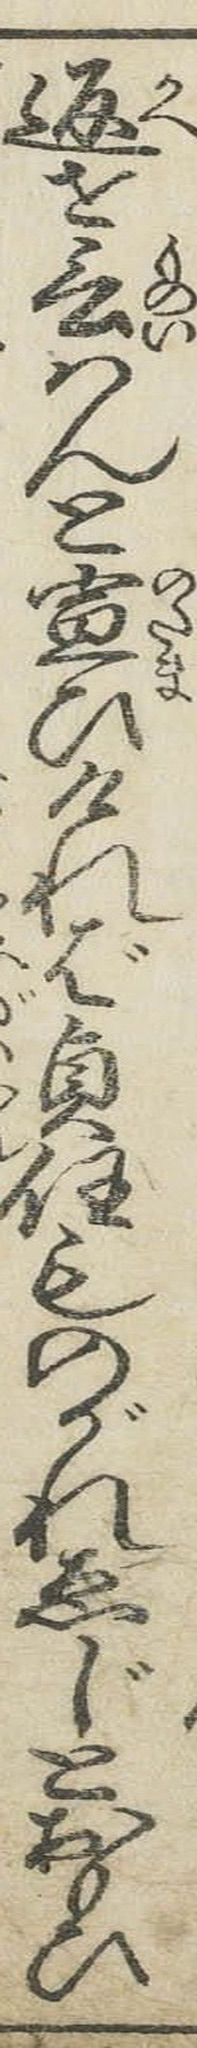返せ言はんと宣ひければ貞任ものがれゑじとおもひ
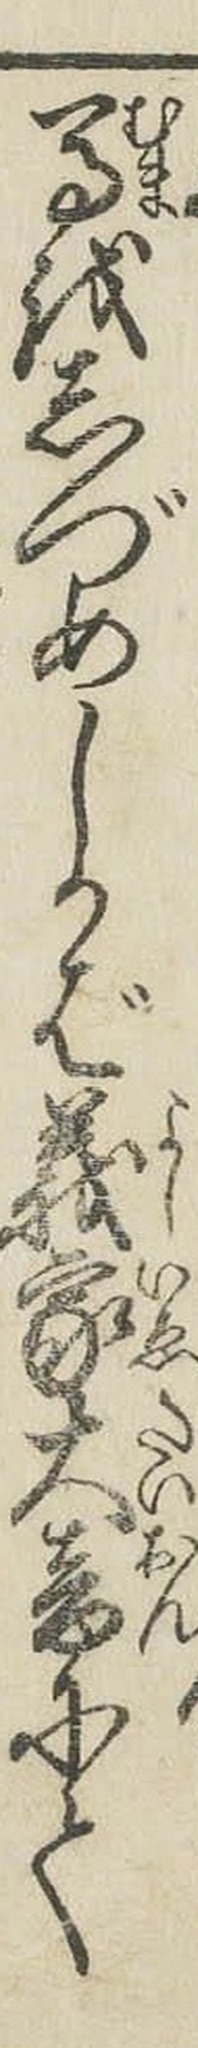馬をしづめしかば義家大音にて
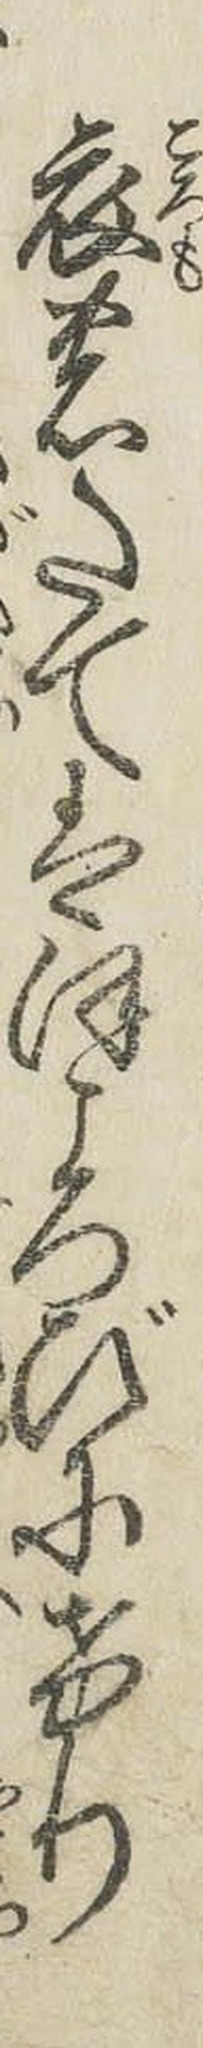衣のたてはほころびにけり
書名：絵本写宝袋 9巻 3之巻
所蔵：東京学芸大学教育コンテンツアーカイブ
